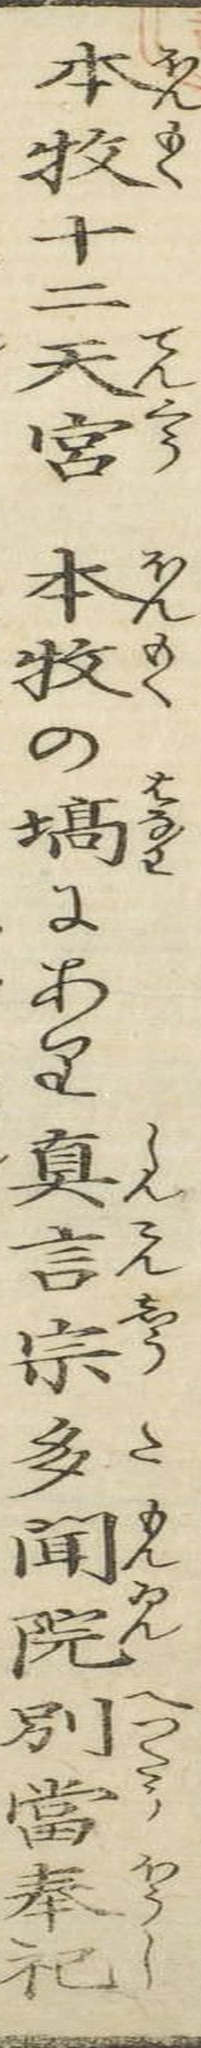本牧十二天宮本牧の塙にあり真言宗多聞院別當奉祀
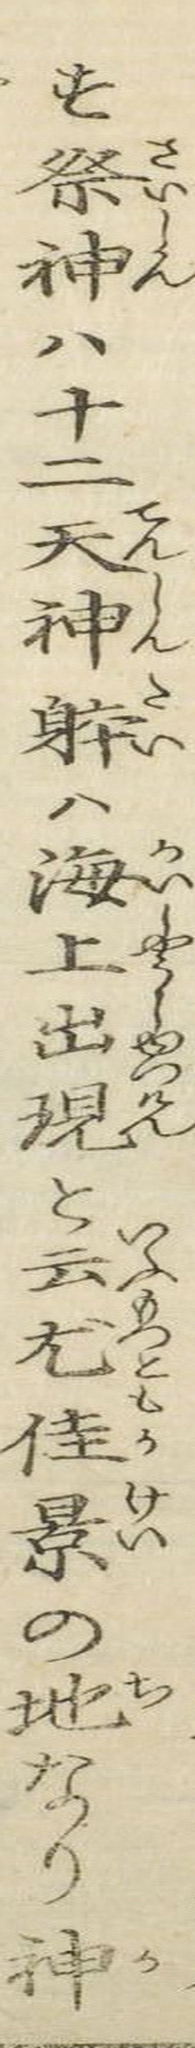す祭神は十二天神躰は海上出現と云尤佳景の地なり神
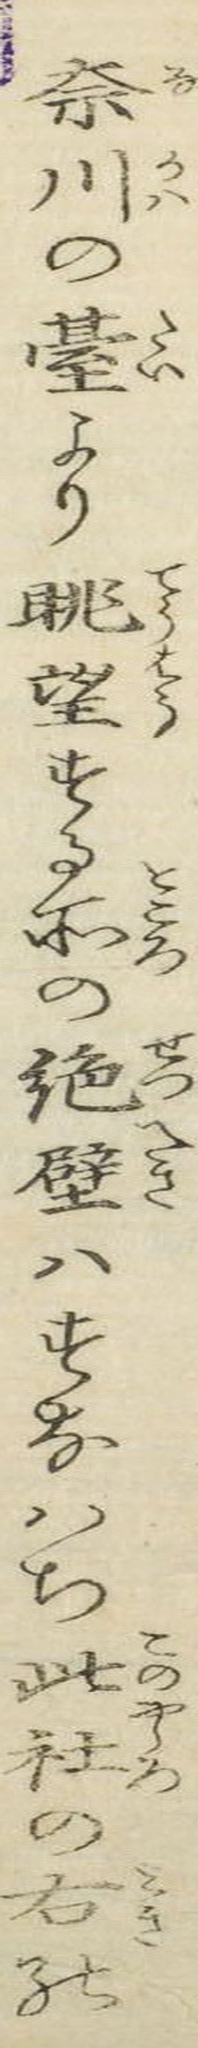奈川の䑓より眺望する所の絶壁はすなはち此社の右の
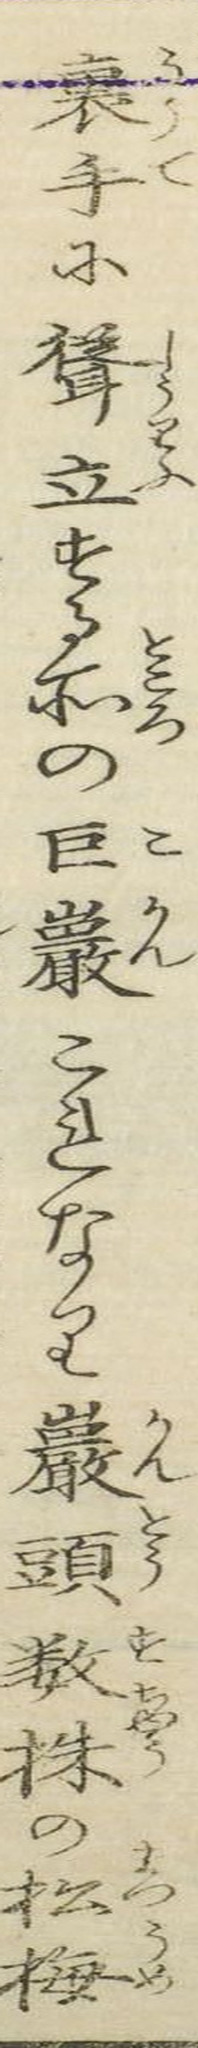裏手に聳立する所の巨巖これなり巖頭数株の松梅
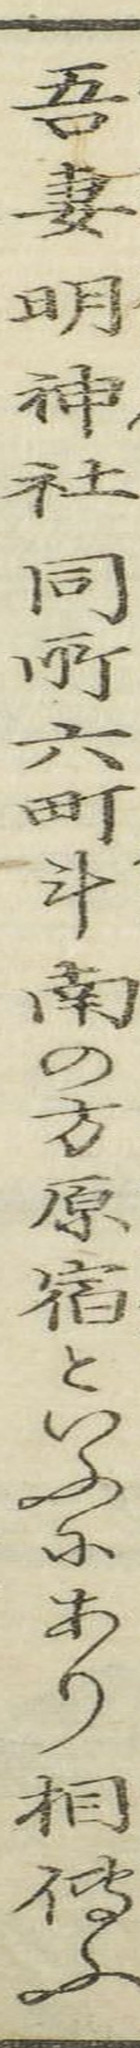吾妻明神社同所六町斗南の方原宿といふにあり相傳ふ
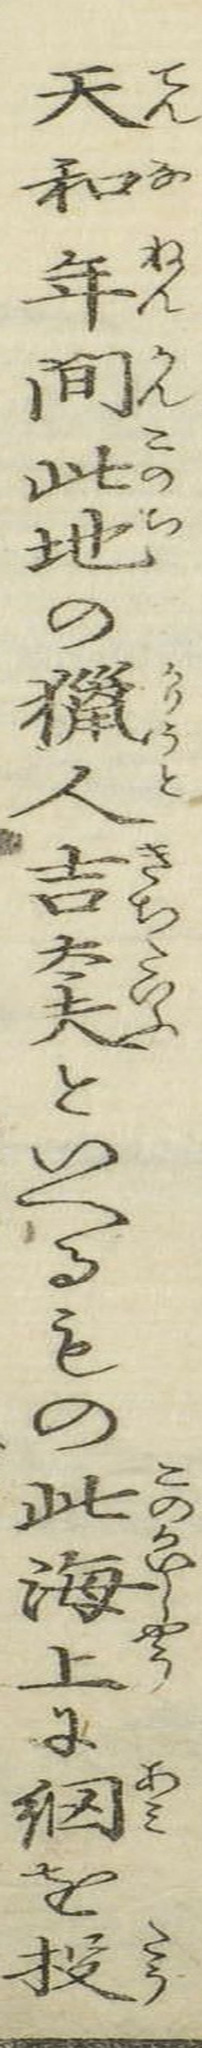天和年間此地の獵人吉太夫といへるもの此海上に纲を投
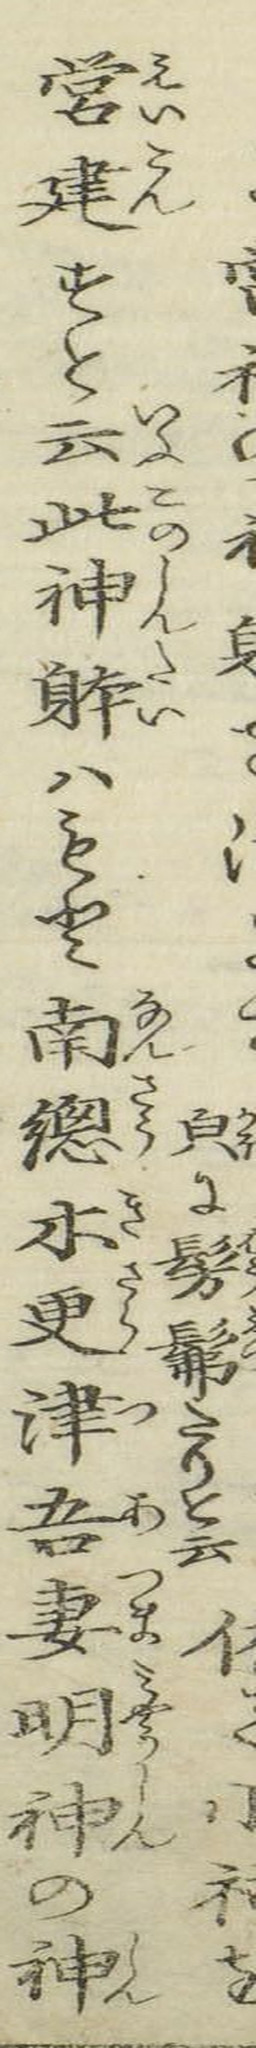営建すと云此神躰はもと南總木更津吾妻明神の神
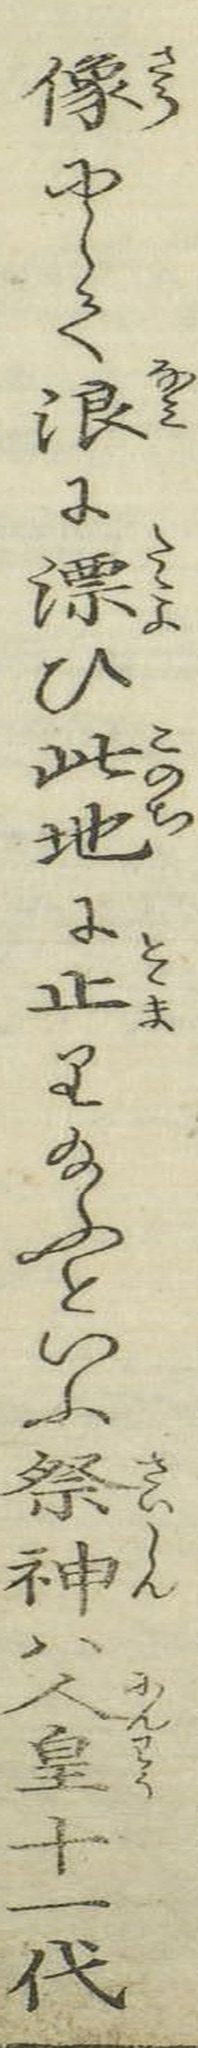像にして浪に漂ひ此地に止り給ふといふ祭神は人皇十一代
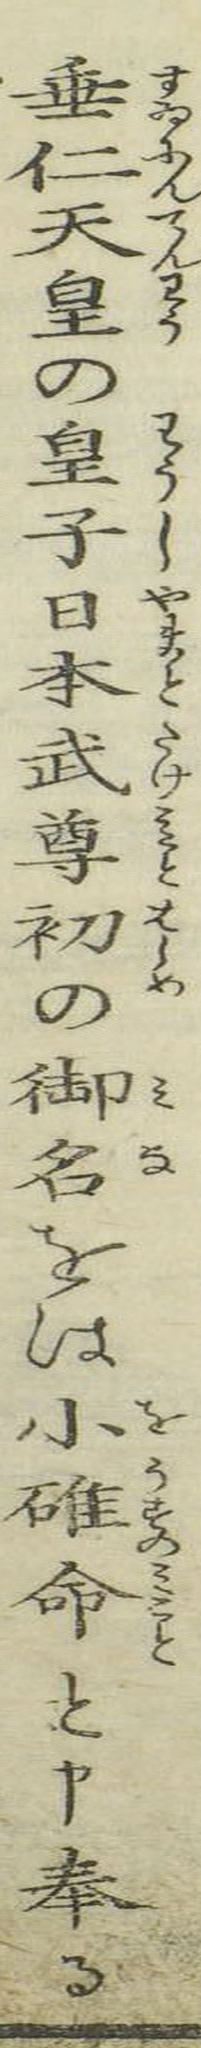垂仁天皇の皇子日本武尊初の御名をは小碓命と申奉る
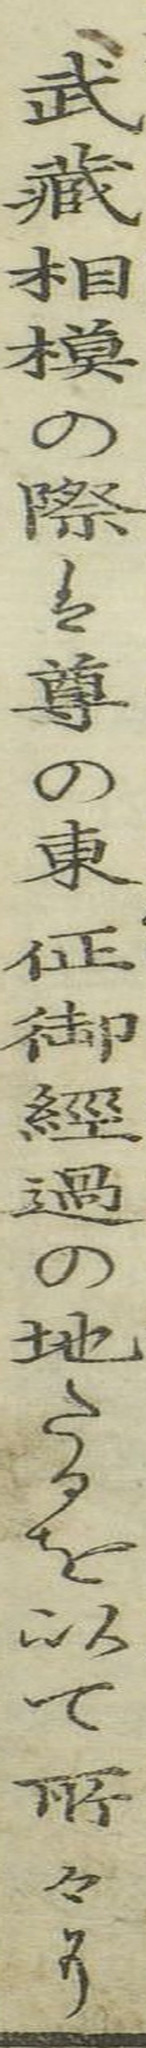武藏相模の際は尊の東征御經過の地たるを以て所々に

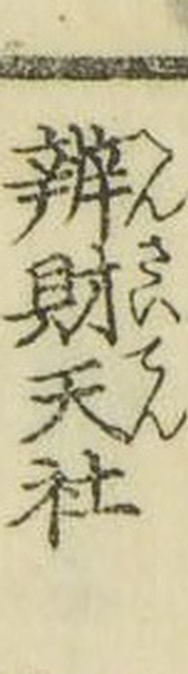辨財天社

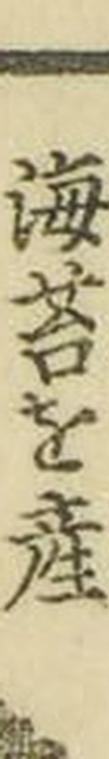海苔を産
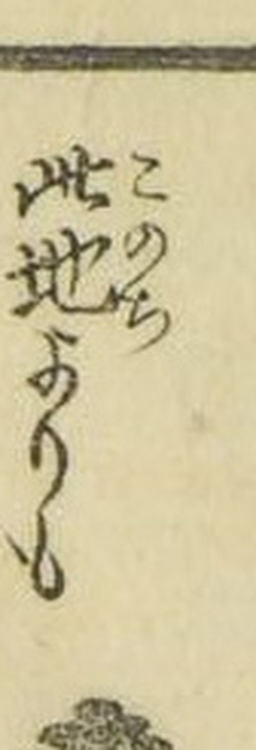此地よりも
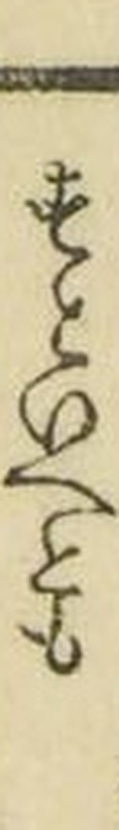すといへとも
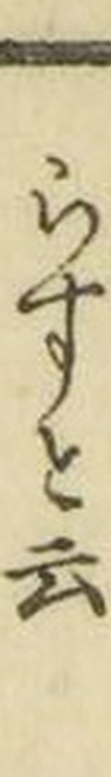らすと云

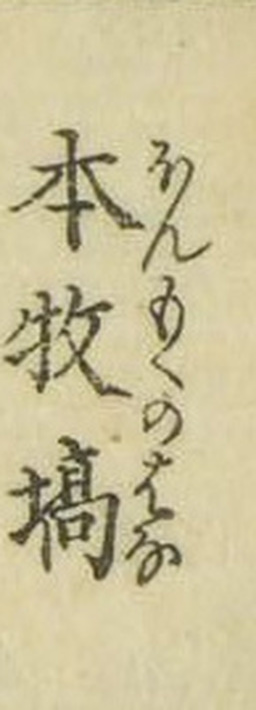本牧塙
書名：江戸名所図会 20巻 巻之6
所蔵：東京学芸大学教育コンテンツアーカイブ
